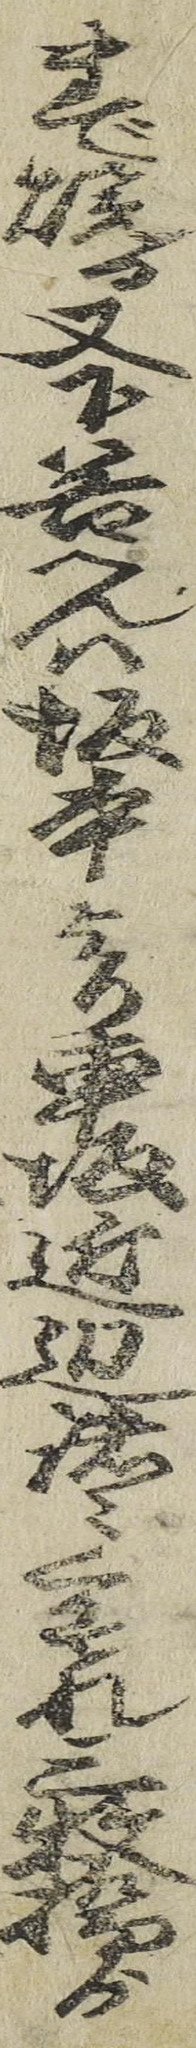まで焼る又下谷へんは坂中より車坂近辺諸々くすれ三枚橋ゟ
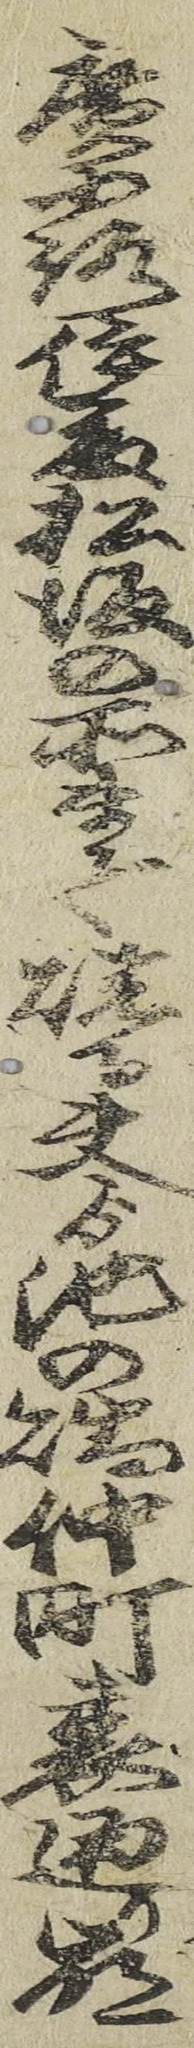広小路伊藤松坂の所まで焼る夫ゟ池の端仲町裏通り崩
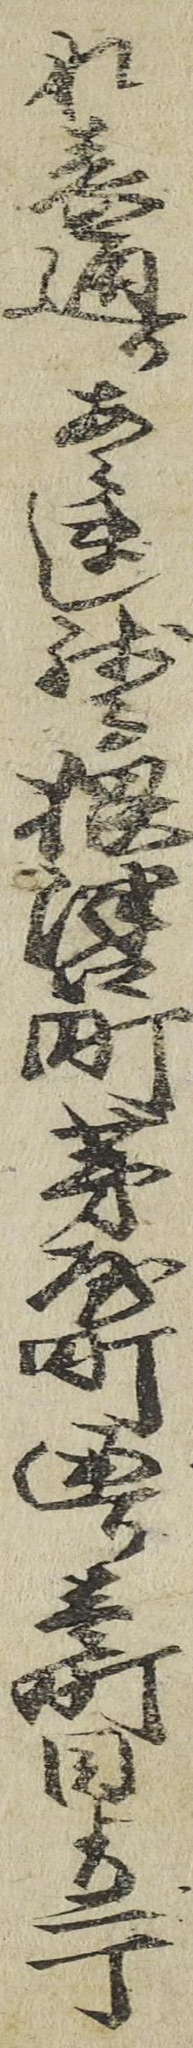れ表通りあらまし残る根津口町茅屋町通り壱町目より二丁
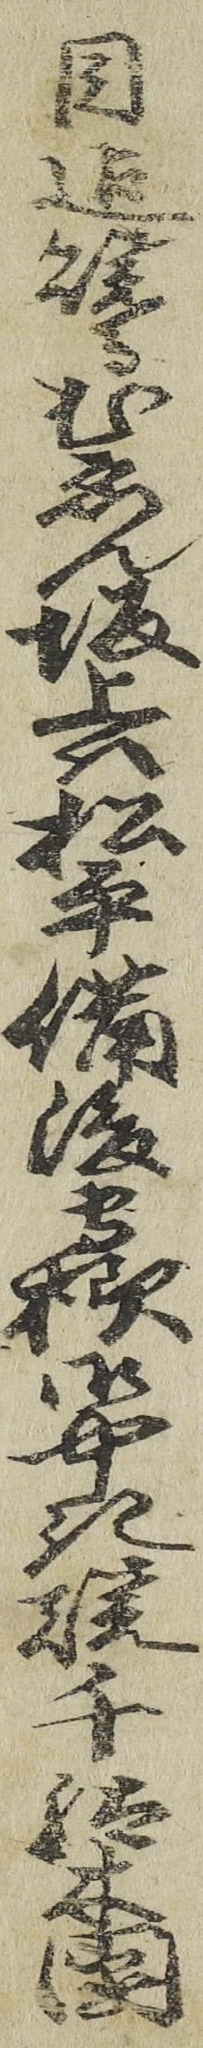目迄焼るむゑん坂上は松平備後守様御やしき焼千駄木団
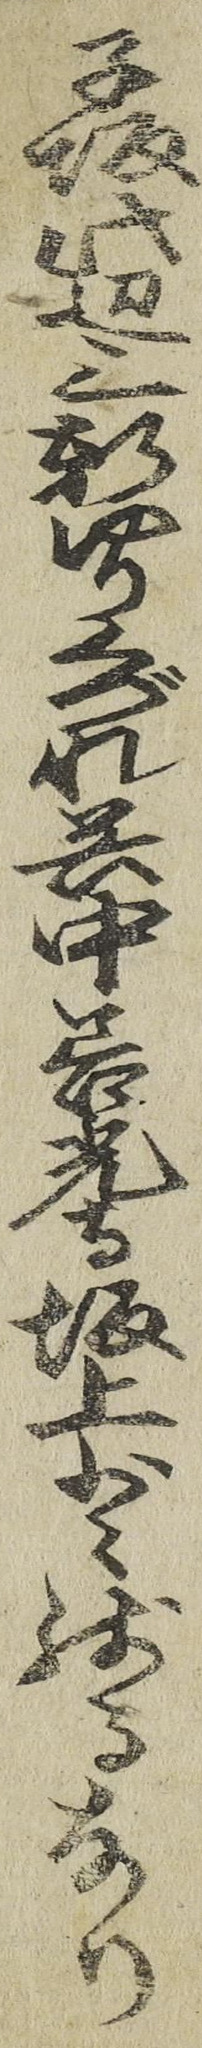子坂此辺三軒ゆりくづれ谷中善光寺坂上少々残るなり

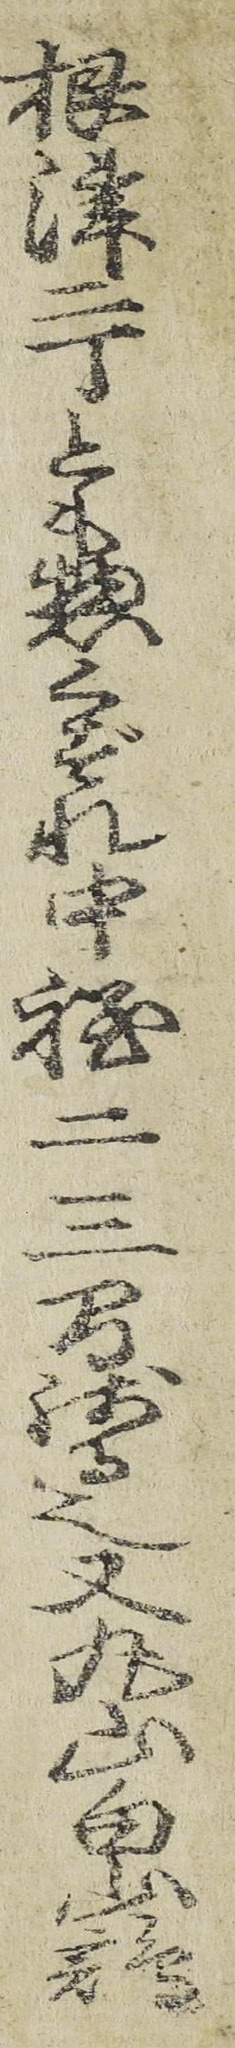根津二丁とも焼くずれ中程二三間残る也又丸山白山鶏
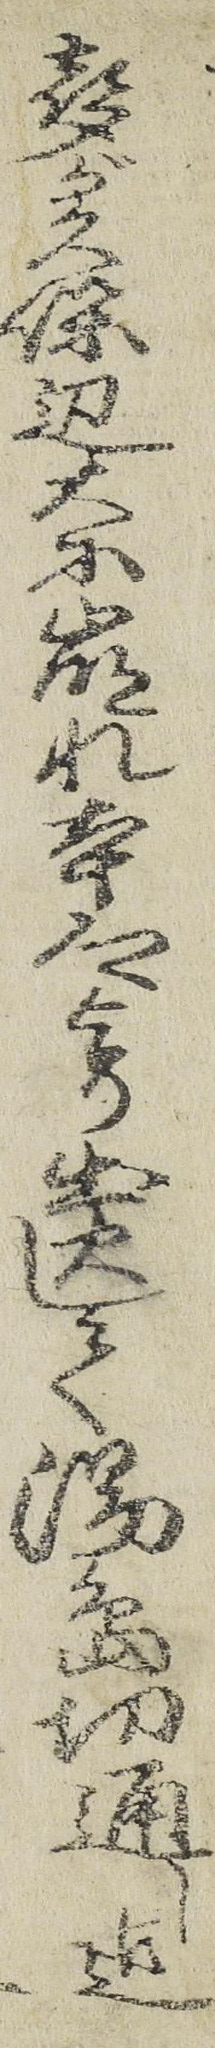声が久保辺大に崩れ本郷より出火して湯島切通し迄
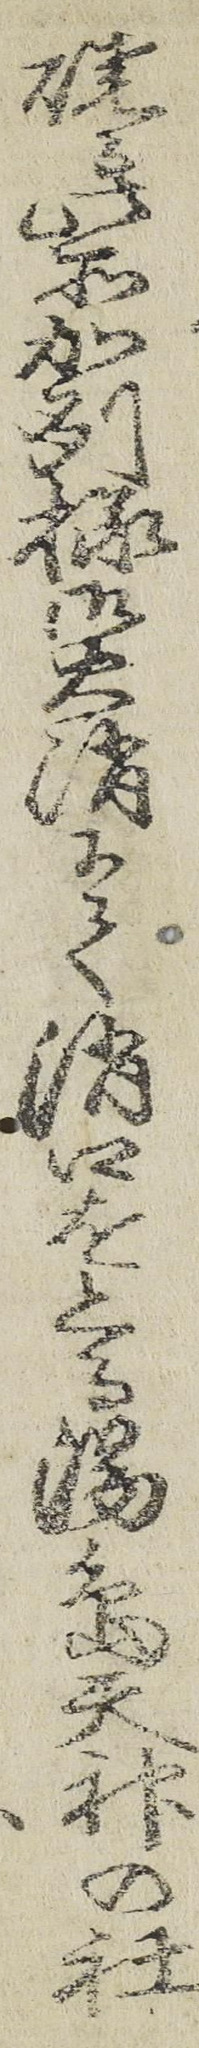焼る此所加州様御火消にて消口をとる湯島天神の社
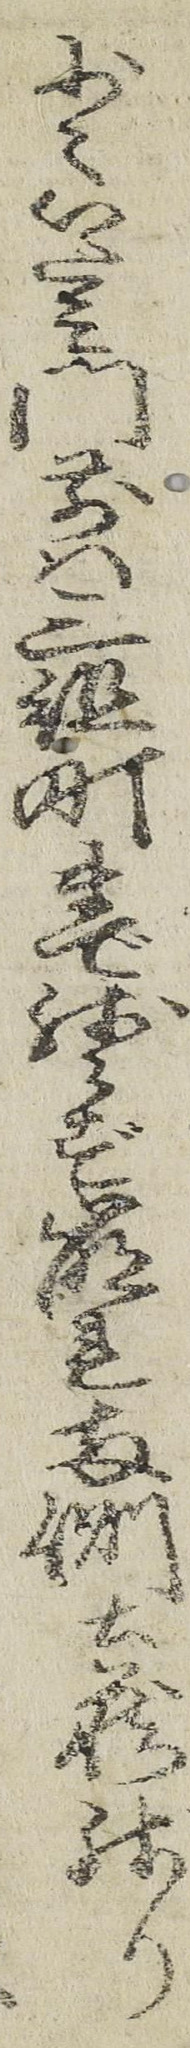少々いたみ門前は三組町まで残らず崩れ両側土蔵残り
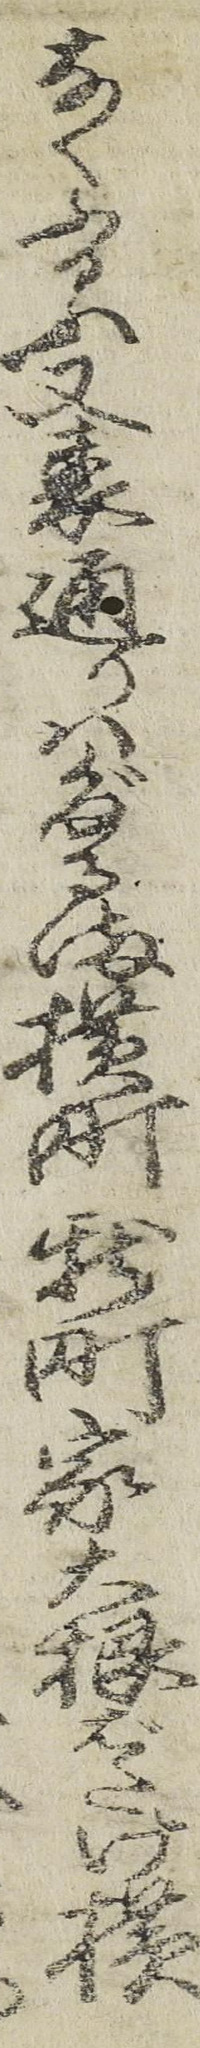なくふるふ又裏通りはだるま横町新町家大根ばたけ横
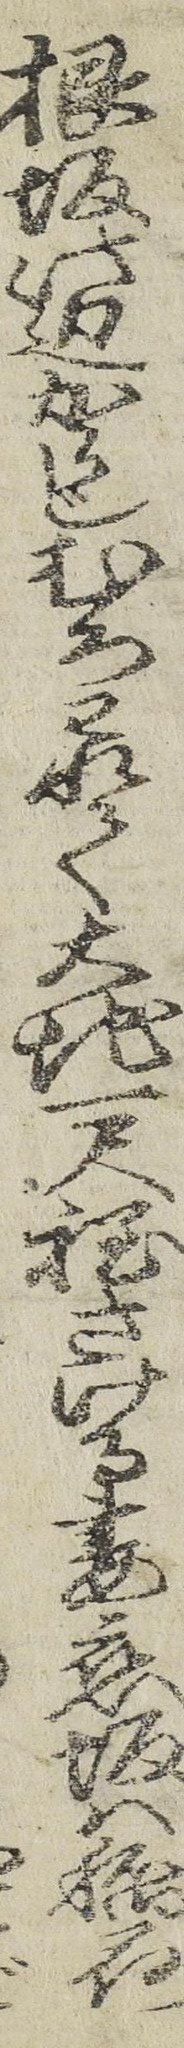根坂此辺かうじむろわれて大地一尺程さける妻恋坂は稲荷
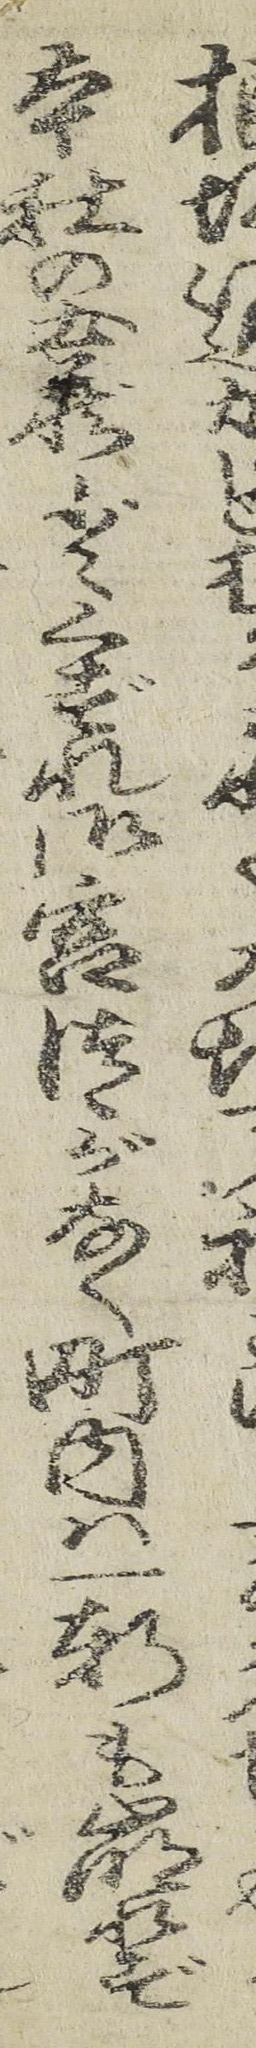本社の土蔵少々くずれ御宮つゝがなく町内は一軒も崩れず
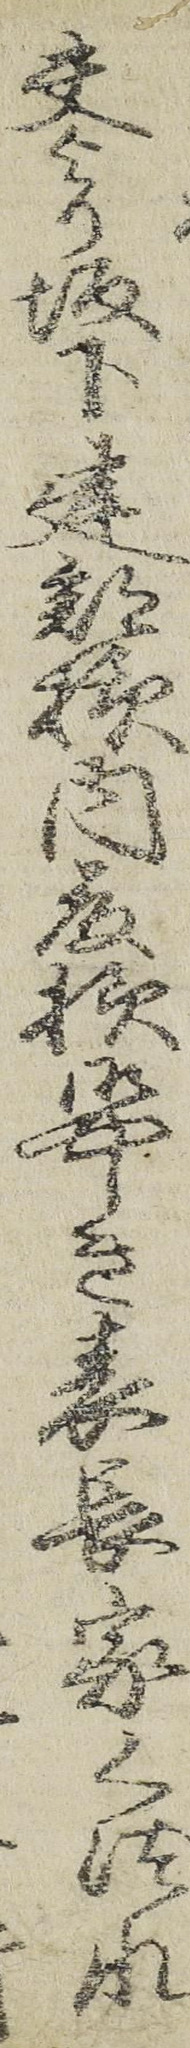夫より坂下建部様内藤様御やしき表長家くずれ
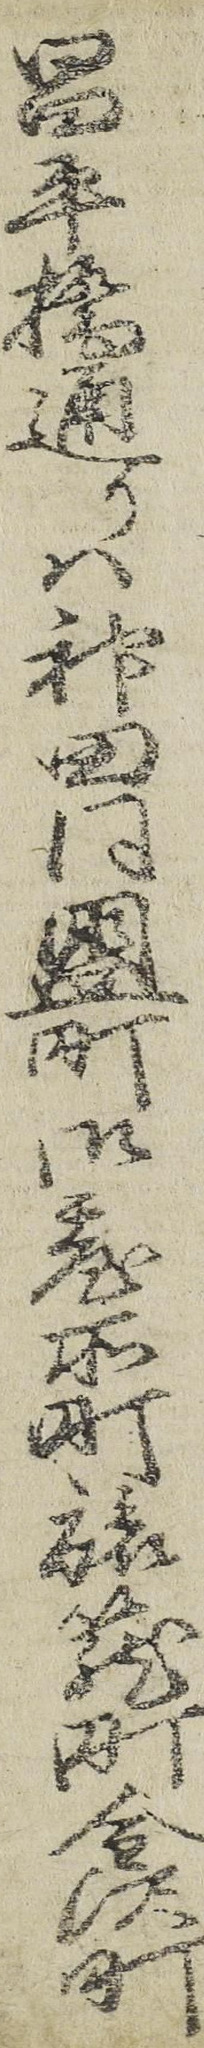昌平橋通りは神田同盟町御蔵前町旅篭町金沢町
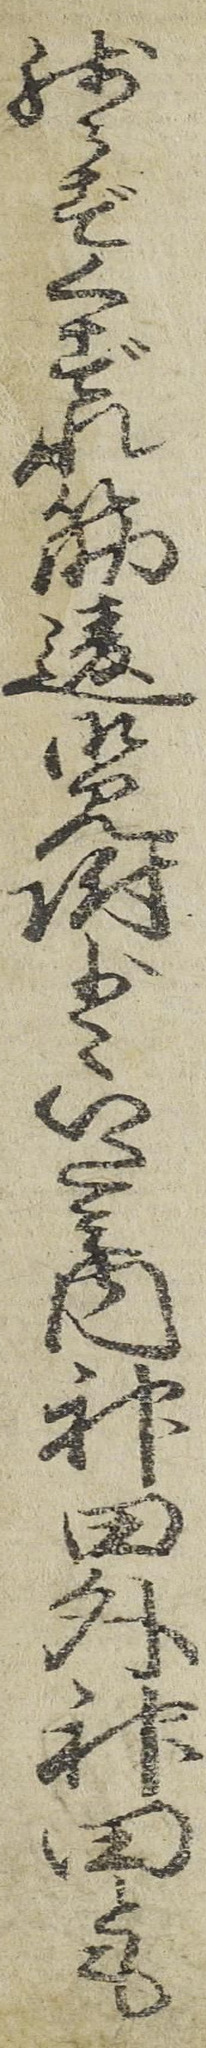残らずくずれ筋違御見附少々いたみ内神田外神田とも

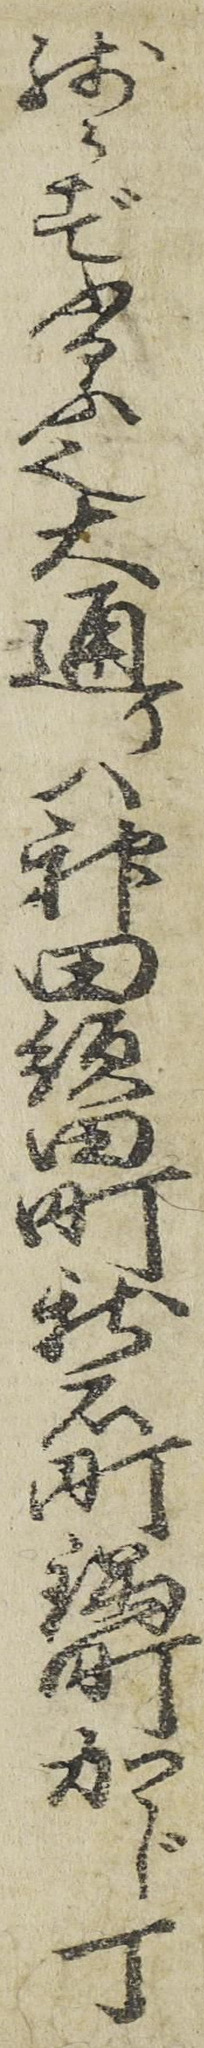残らずふるふ大通りは神田須田町新石町鍋町かじ町
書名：安政大地震畧記　全
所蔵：東京大学地震研究所図書室 Earthquake Research Institute Library, The University of Tokyo, JAPAN
